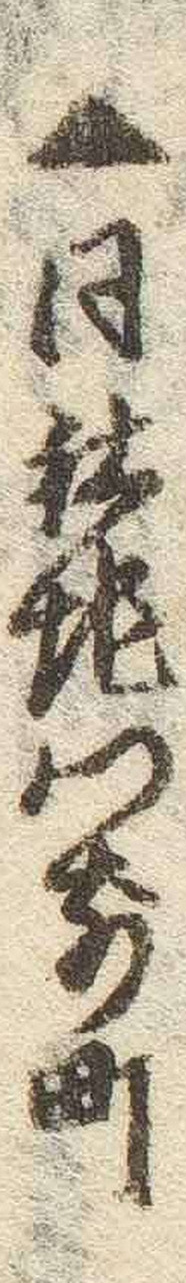▲同社地門前町
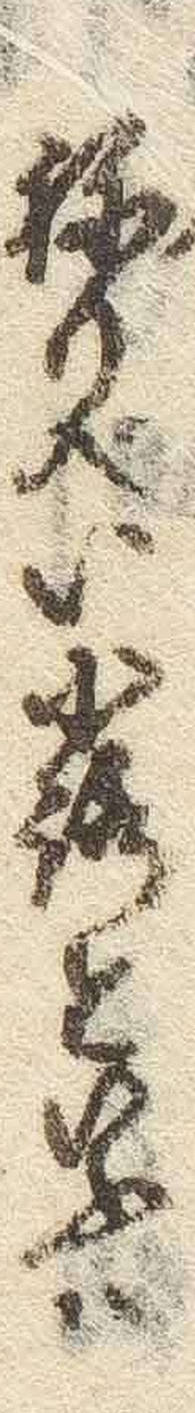ねりべい小路といふは
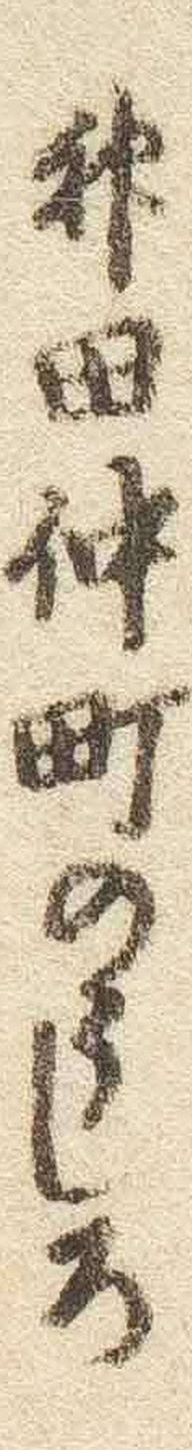神田仲町のうしろ
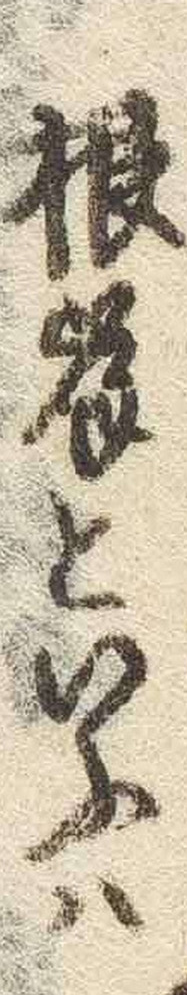根岸といふは
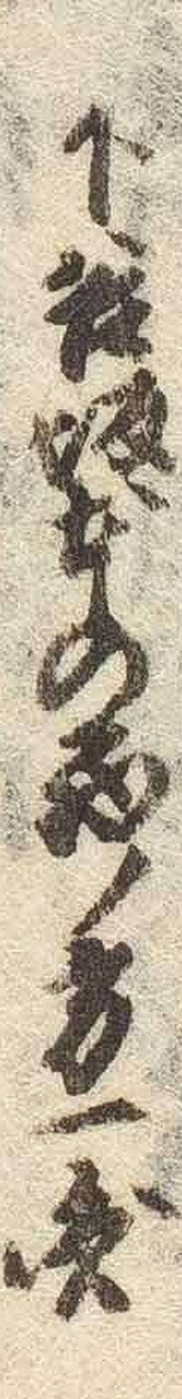下谷坂本の西ノ方一円
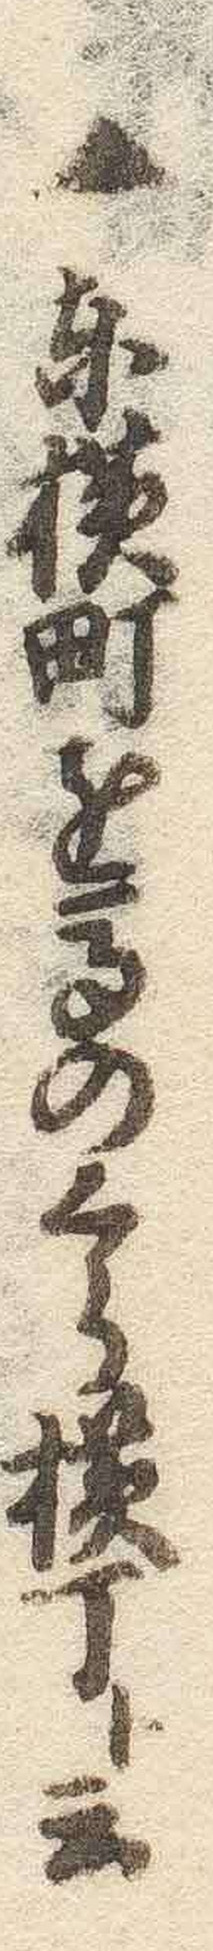▲東横町を馬のくら横丁ト云
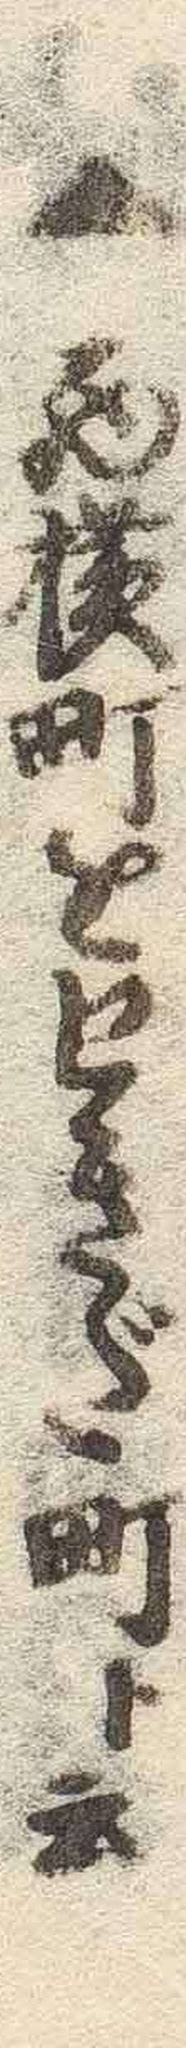▲西横町をせきだ町ト云
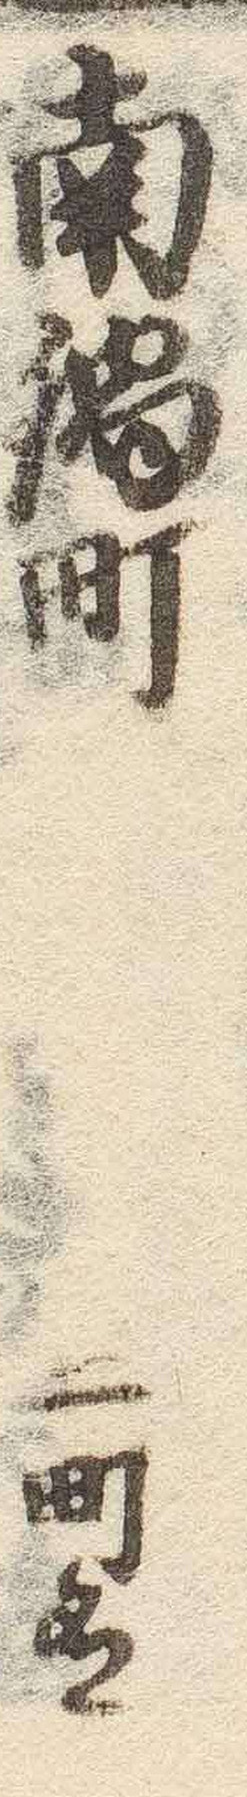南鍋町二町有
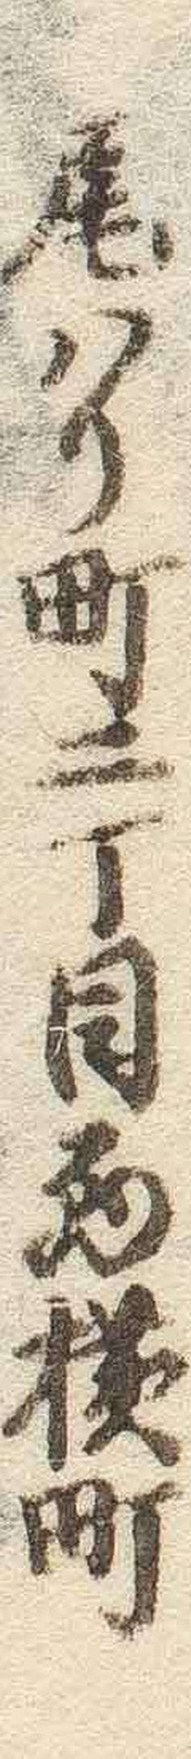尾はり町二丁目西横町
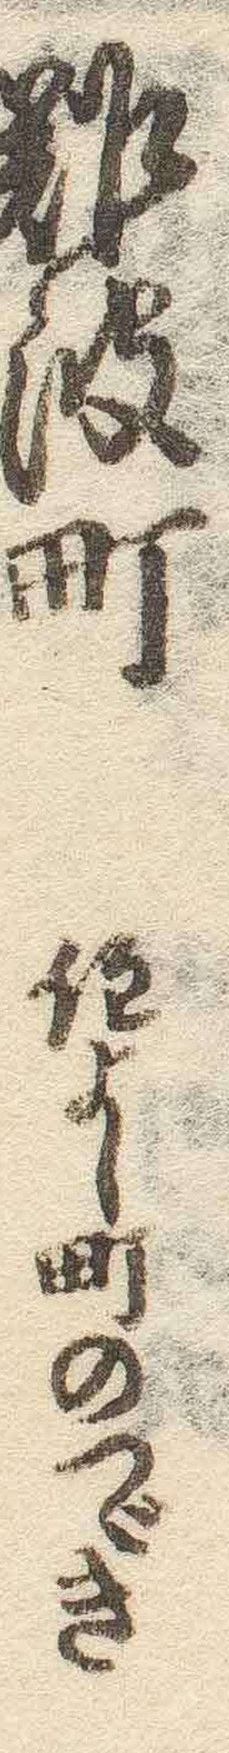難波町住よし町のつゞき
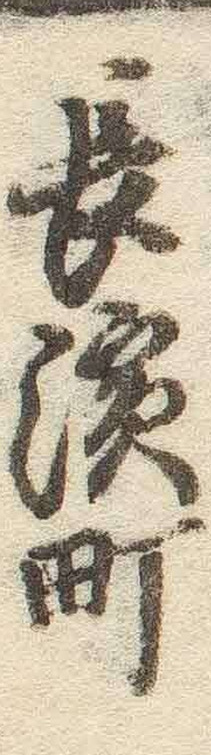長崎町
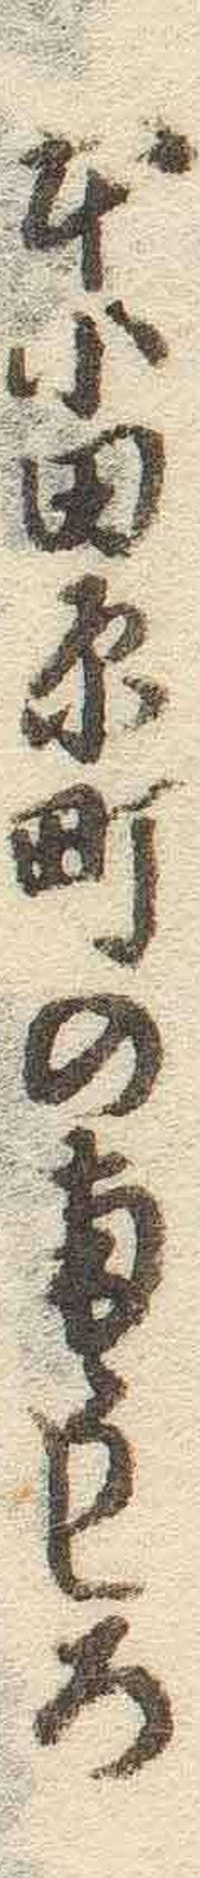本小田原町の南うしろ
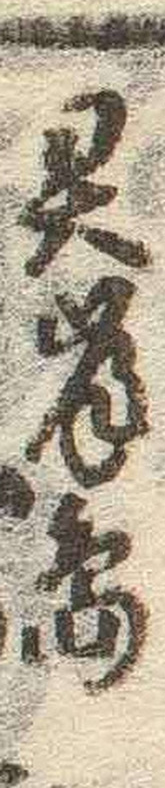霊岸島
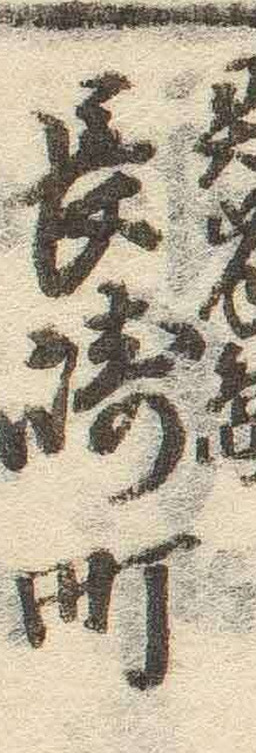長崎町
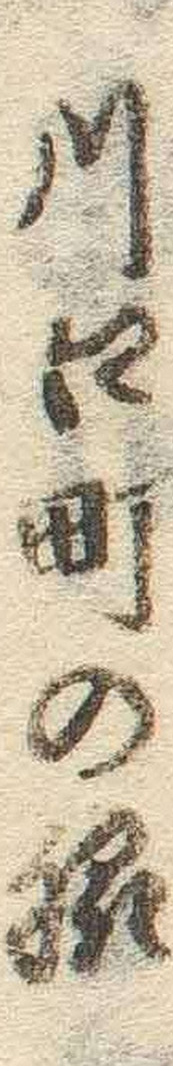川口町の脇
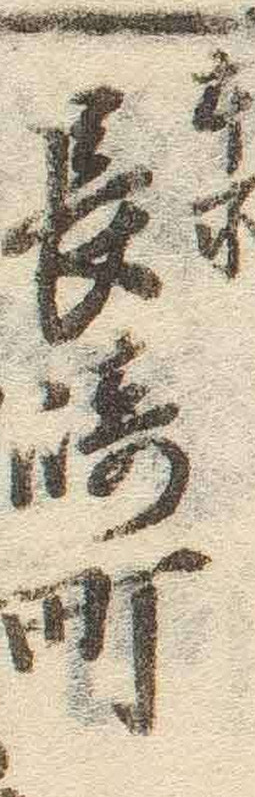長崎町
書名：江戸町独案内
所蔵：東京学芸大学附属図書館 国文学研究資料館
